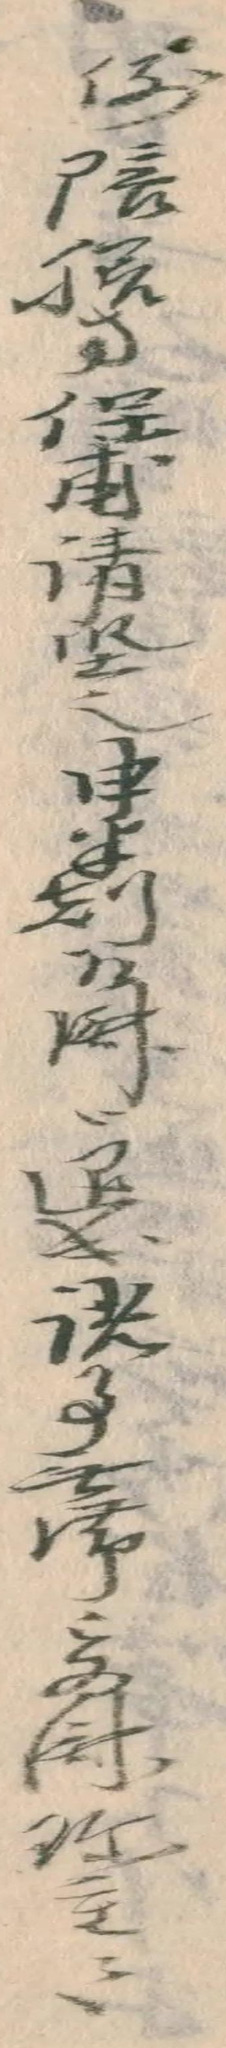例陪膳方保甫清堅也申半刻取済御退出諸事無滞被為済珍重々々
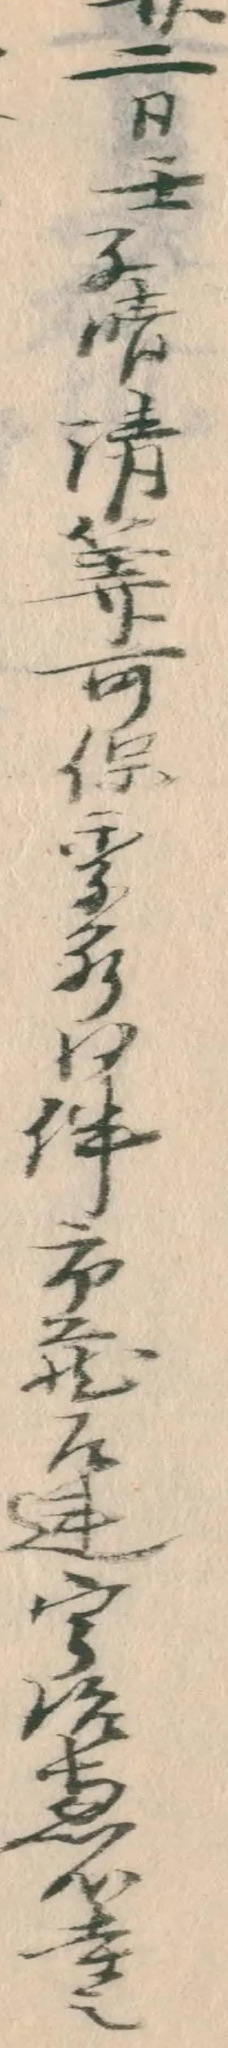廿二日壬子晴清算可保季同伴市蔵召連宇治恵心寺之
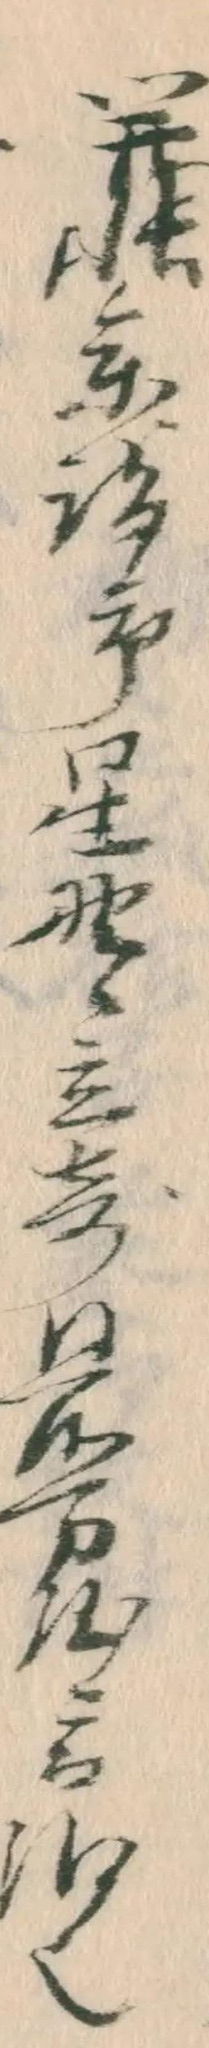開帳参詣予星野ヘ立寄同所万屋ニ而泊也
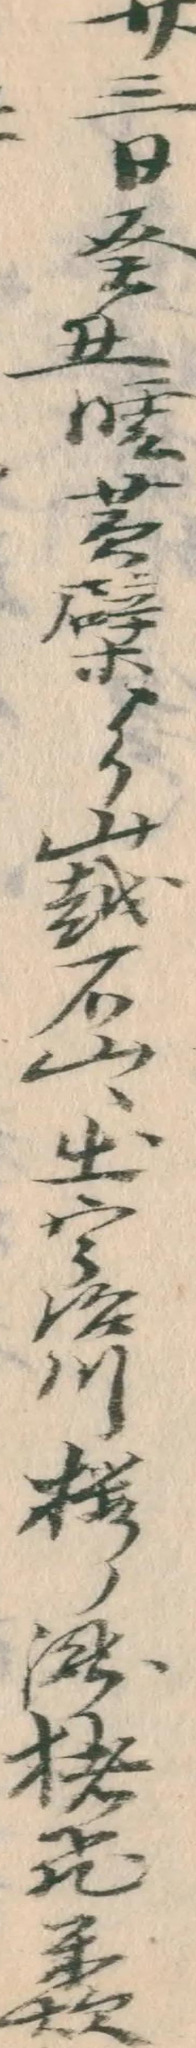廿三日癸丑曇黄檗より山越石山へ出宇治川桜ノ瀧猪飛米炊
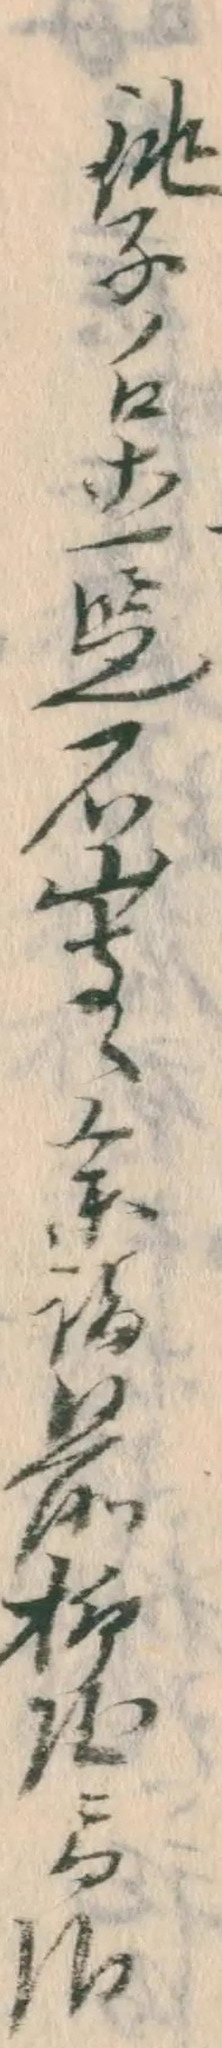挑子召等一覧石山寺へ参詣同前柳屋ニ而泊
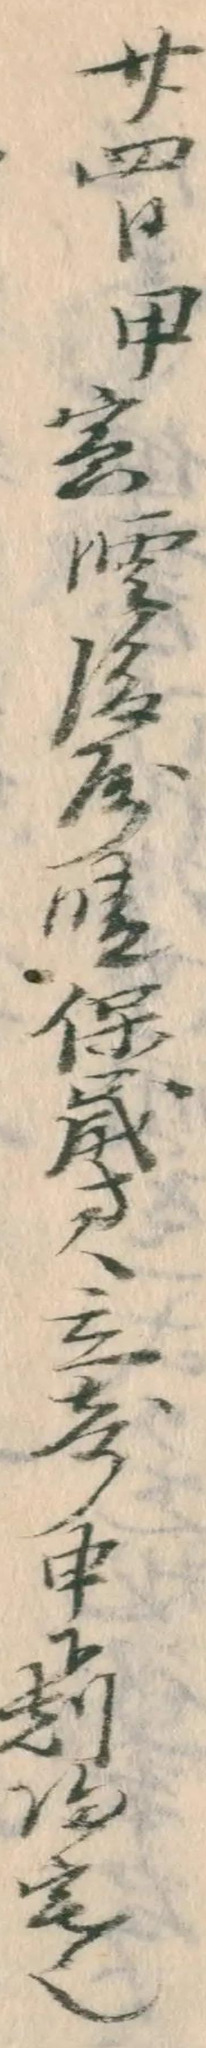廿四日甲寅曇後属晴保歳方へ立寄申下刻帰宅也
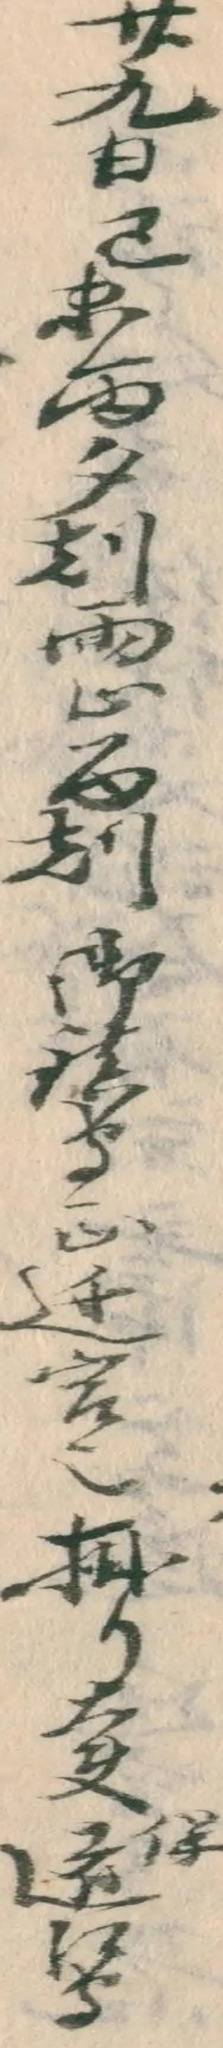廿九日己未雨夕刻雨止酉刻御鎮守正遷宮也掛り大夫保遠江守
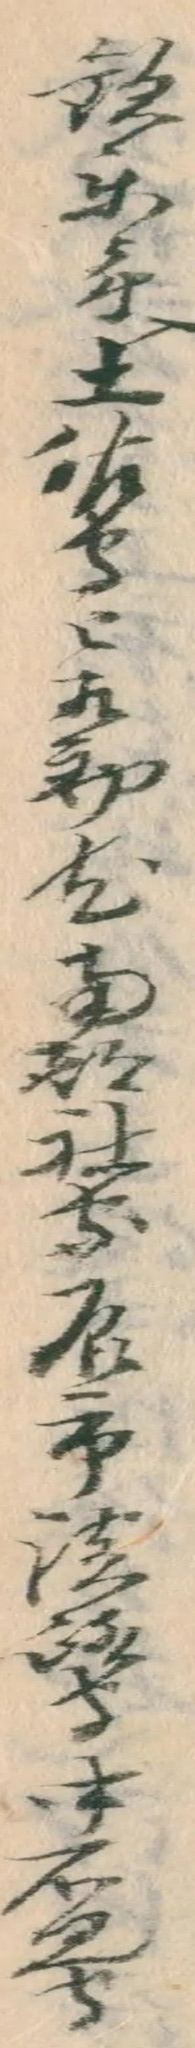歓楽ニ付入土佐守被相勤尤南都社家辰市淡路守中石見守

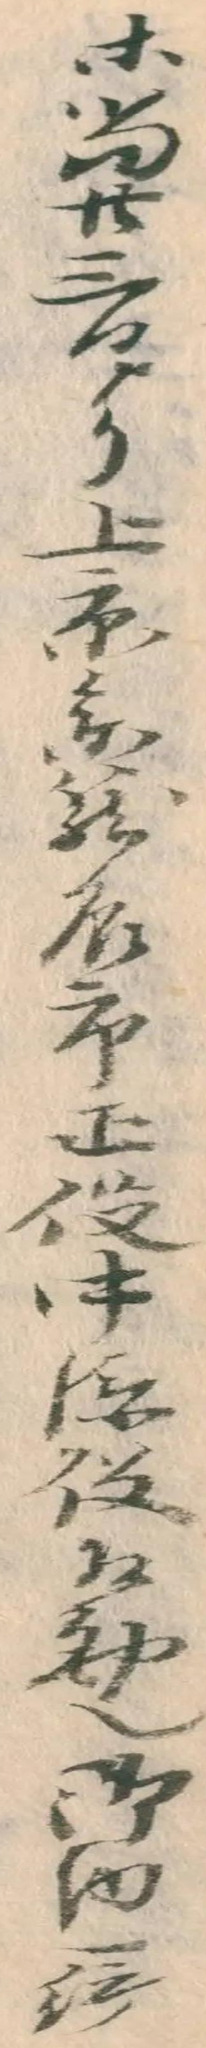等當廿三日より上京参籠辰市正役中添役相勤也御内一統
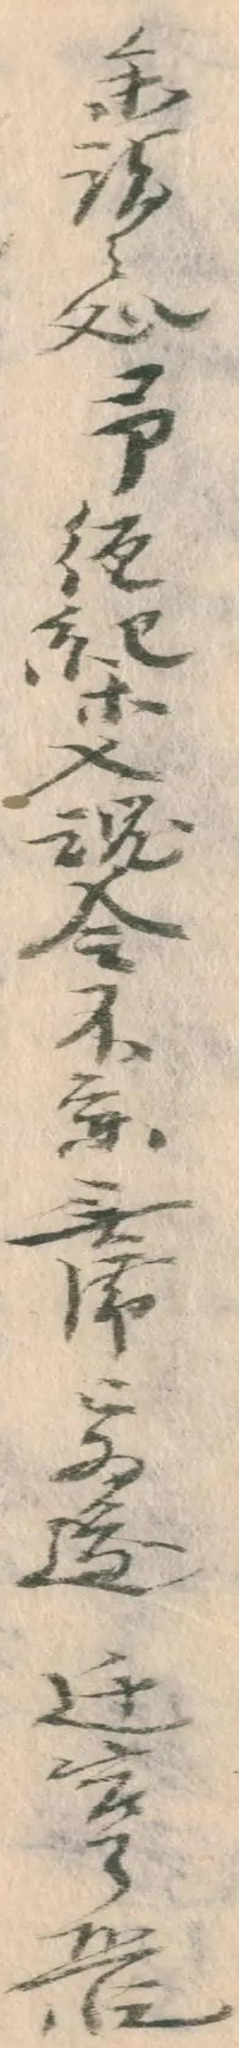参詣之処予経紀等入魂令不参無滞被為遂遷宮了恐悦
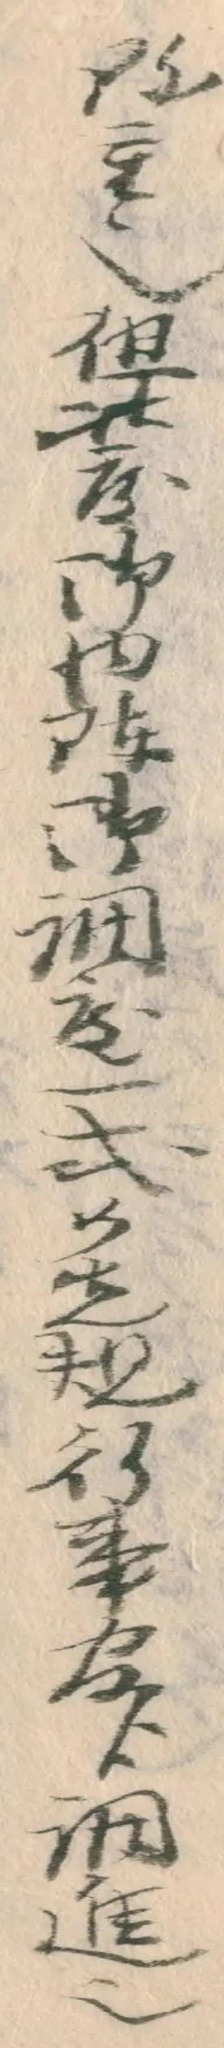致重也但此度御内陣御調度一式如先規行事官ゟ調進也
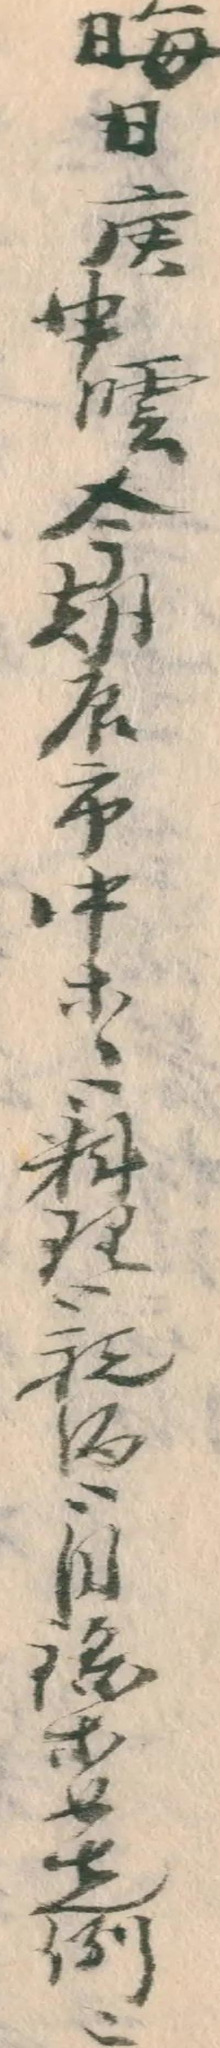晦日庚申曇今朝辰市中等へ御料理御祝酒御目録等如先例被
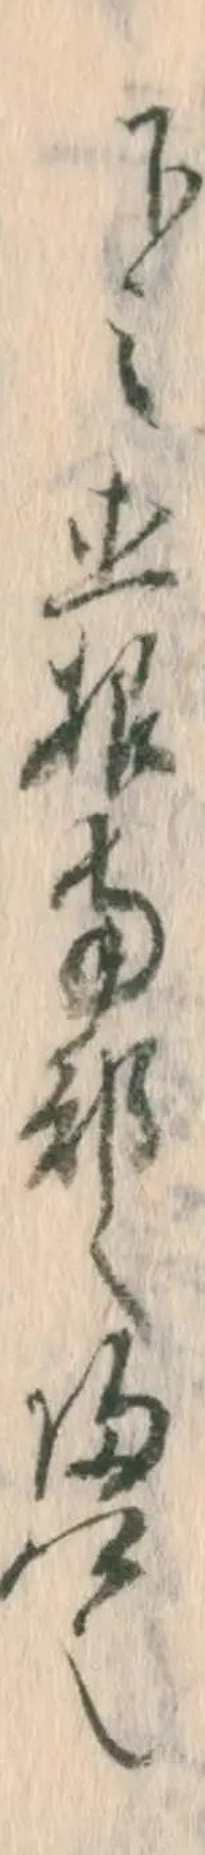下也直様南部へ帰郷也
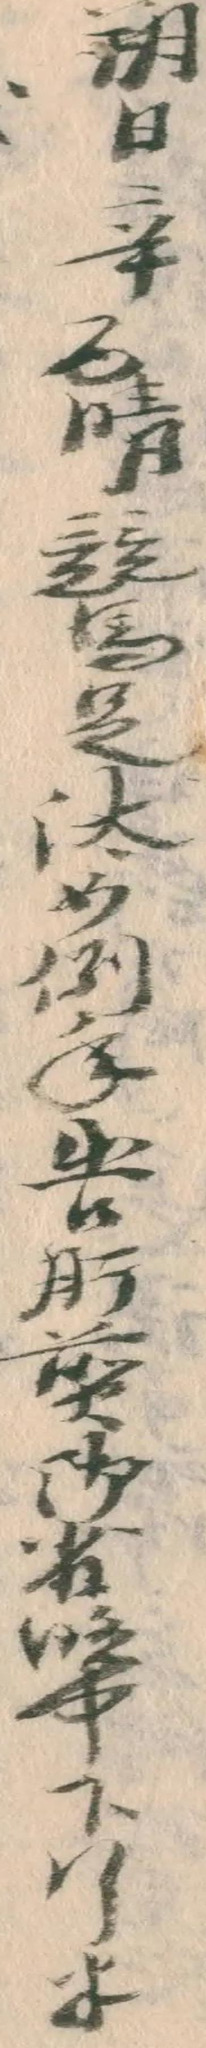朔日辛酉晴競馬足汰如例年出口肝煎御省略中下行米
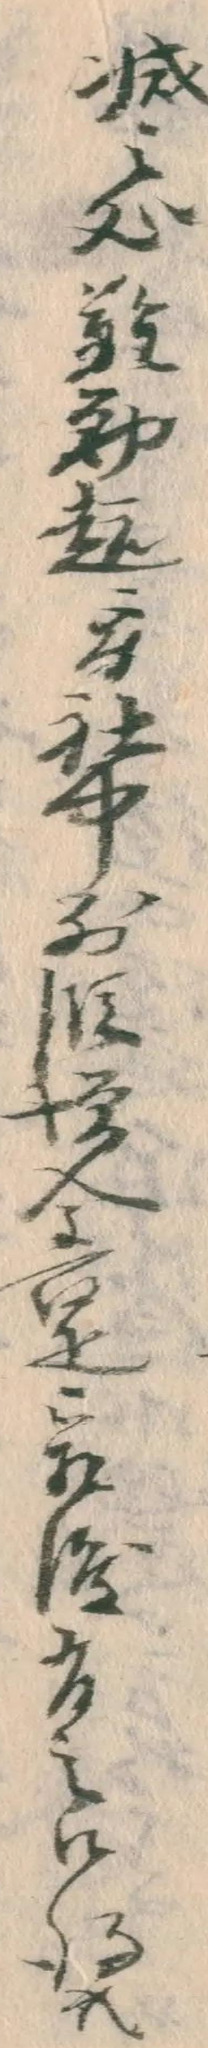滅之処難勤趣二付社中別段増金百疋被相渡有之候得共
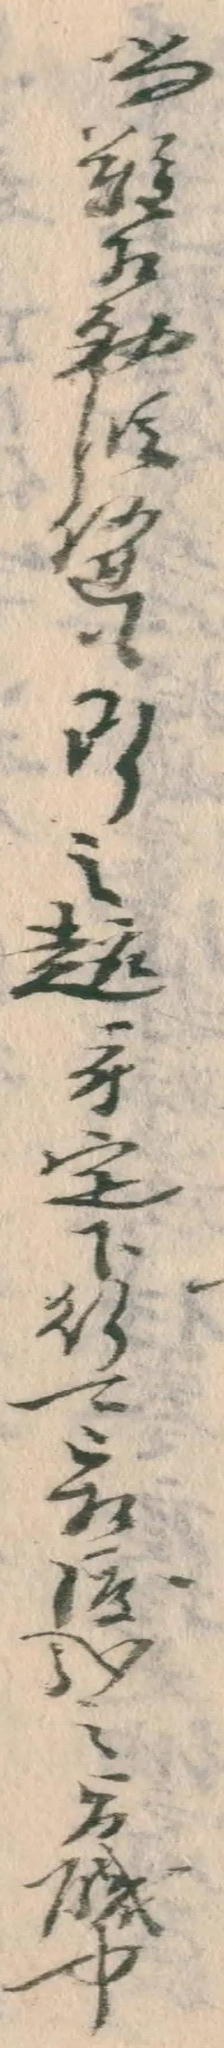當難相勤段何れも断之趣ニ付定下行可被相渡哉之旨職中
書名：賀茂社記録. 第70冊
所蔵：国立国会図書館 National Diet Library, JAPAN
